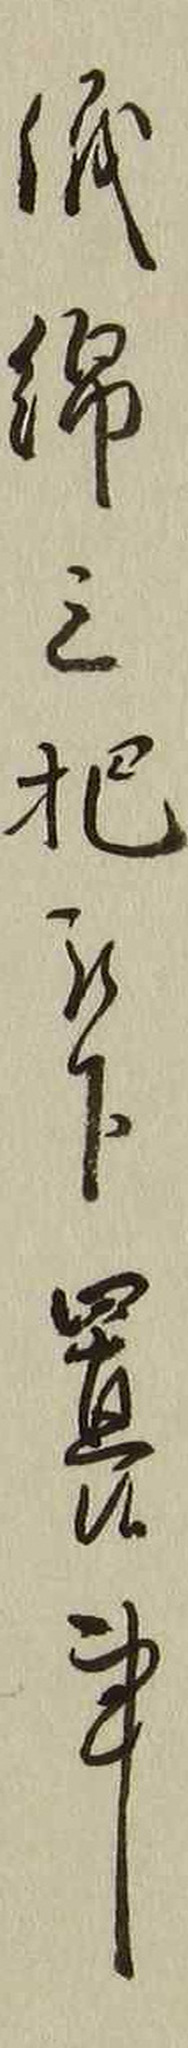儀綿三把被下置候事
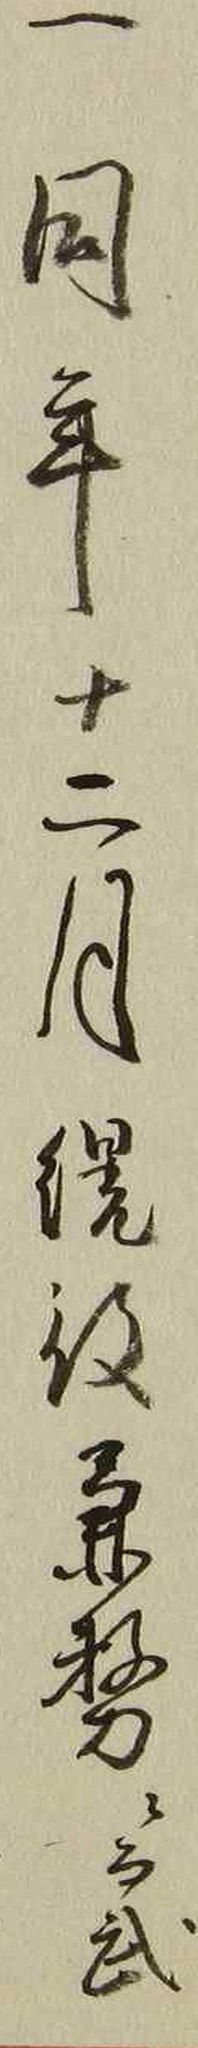一同年十二月幌役兼務に而武
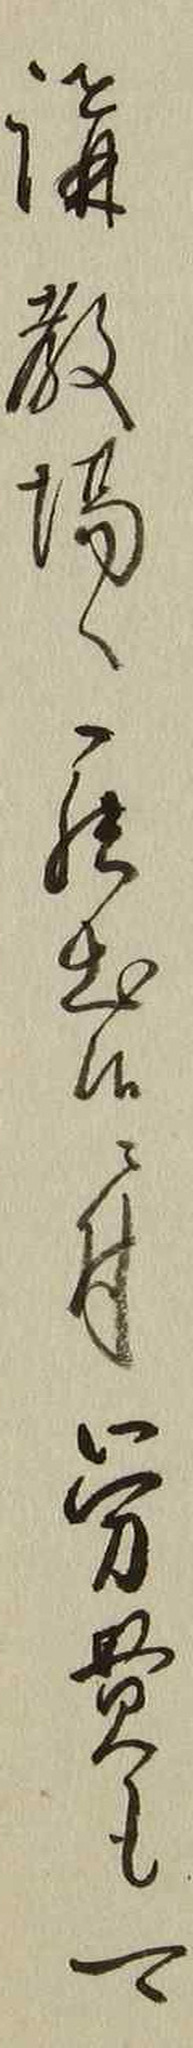講教場へ罷出候に付労費も可
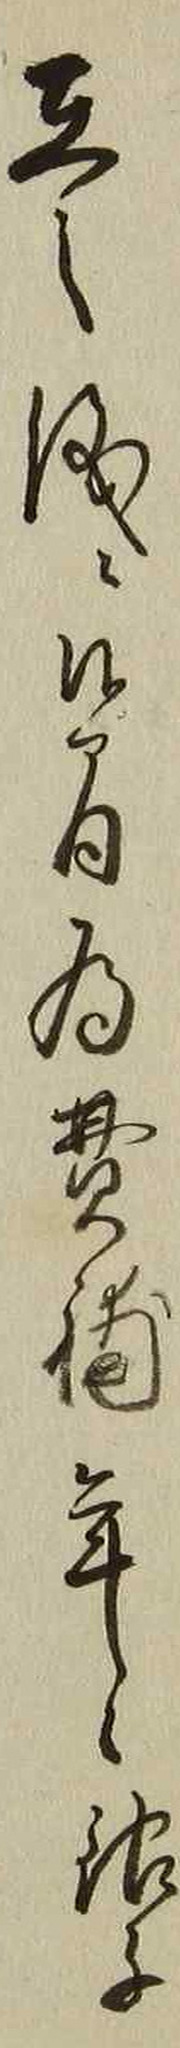在之儀に候間為費補年々銀子
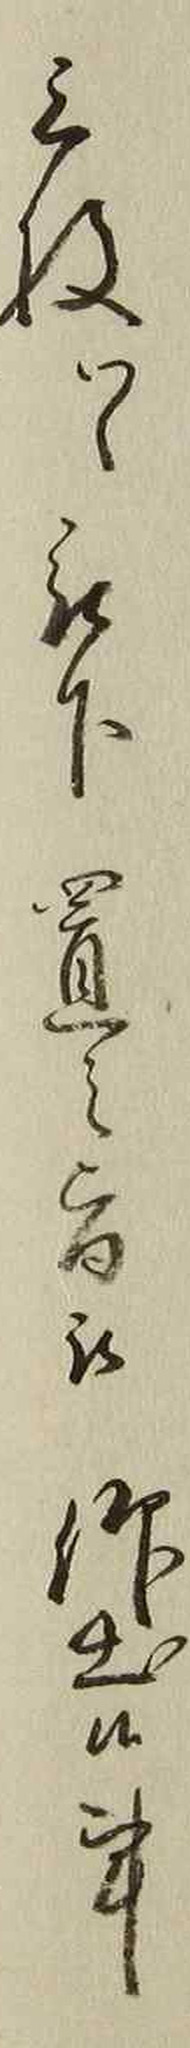三枚ツヽ被下置の旨被仰出候事
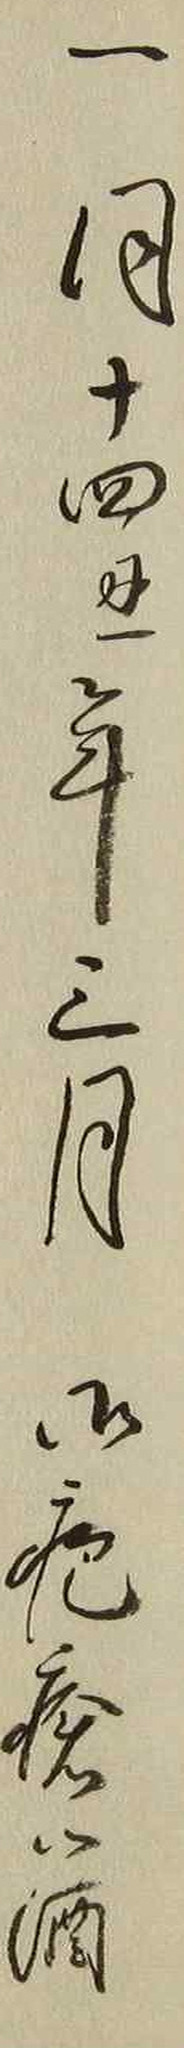一同十四丑年三月御疱瘡は酒
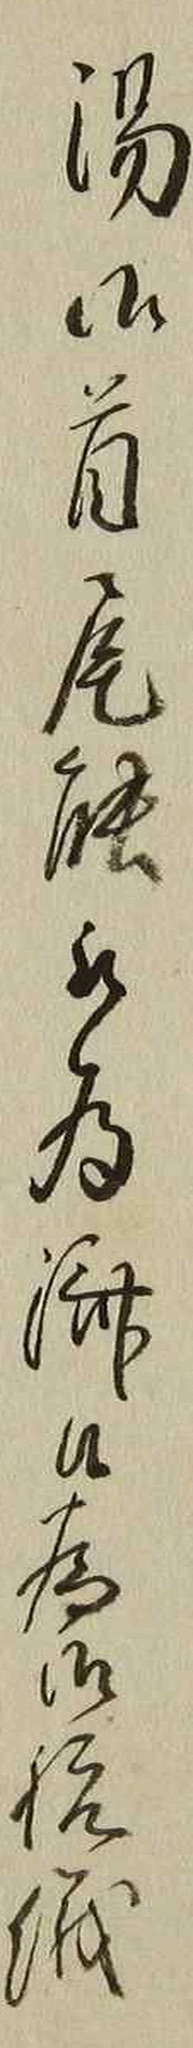湯御首尾能被為済候為御祝儀
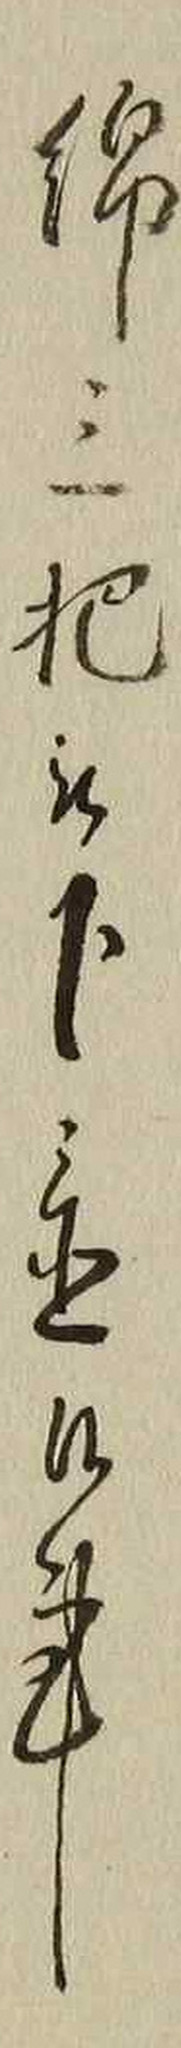綿三把被下置候事
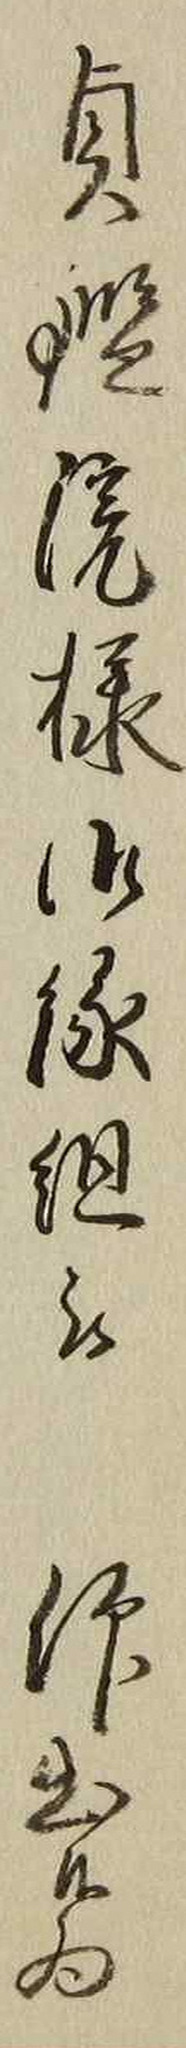貞鑑院様御縁組被仰出候為
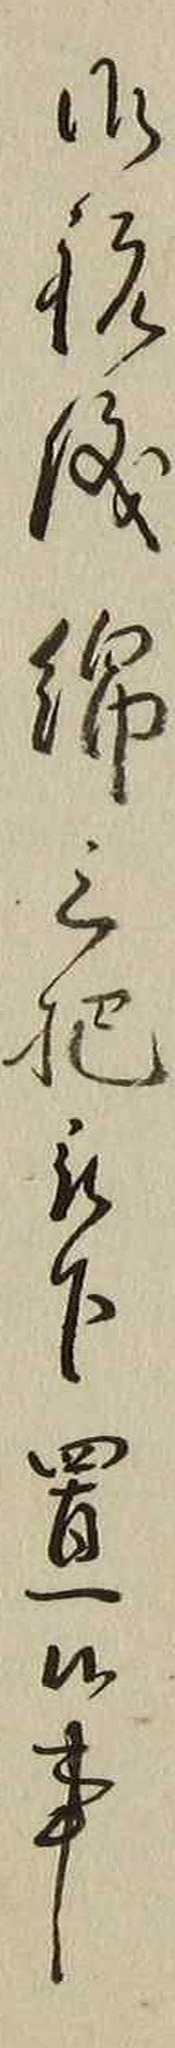御祝儀綿三把下置候事
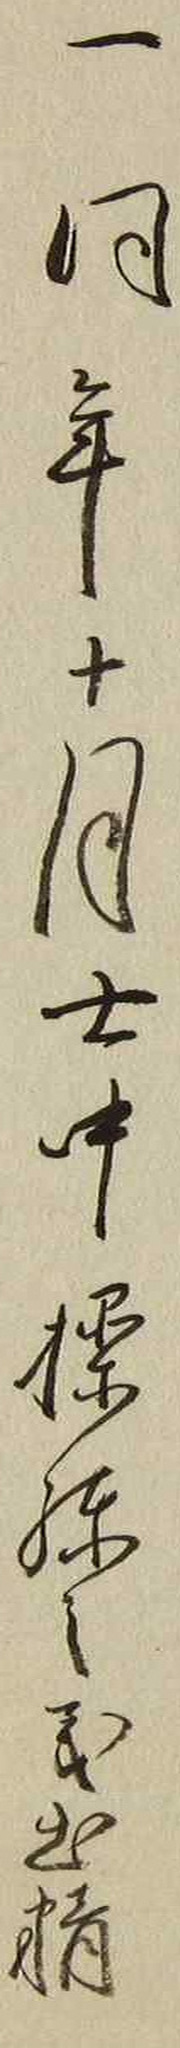一同年十月士中操練の義出精
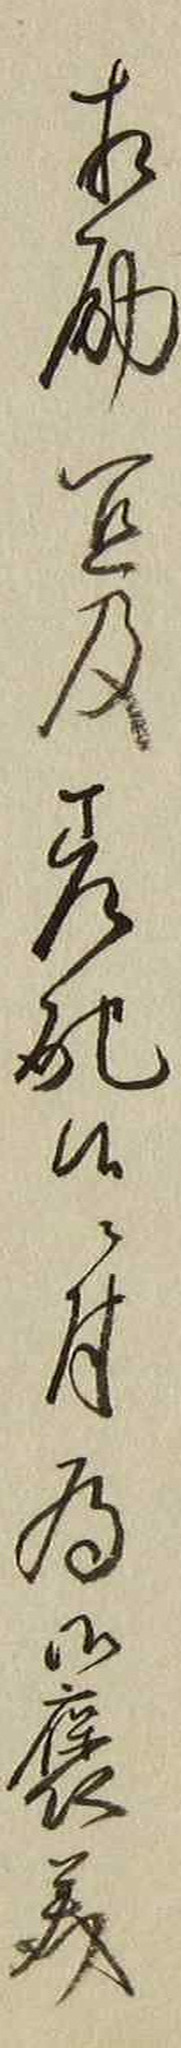相勤宜及差配候に付為御褒美
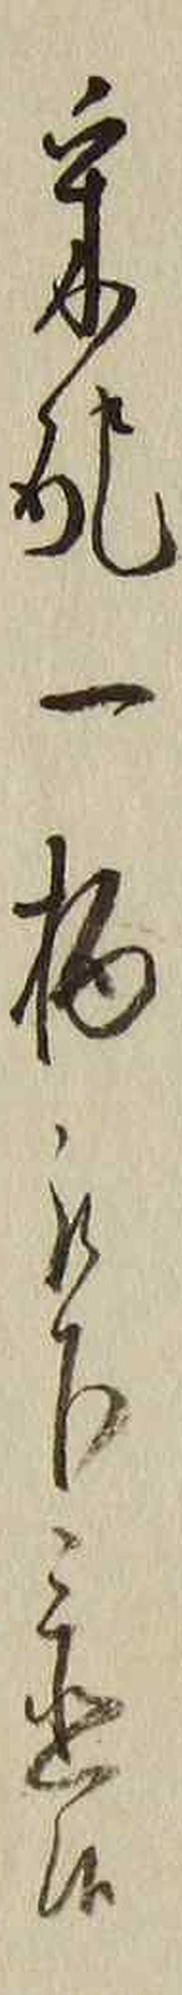采配一柄被下置候
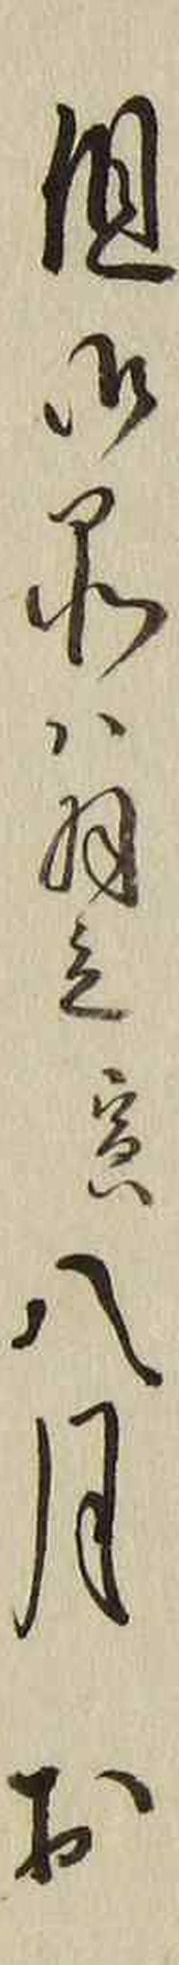但御品は翌寅八月於

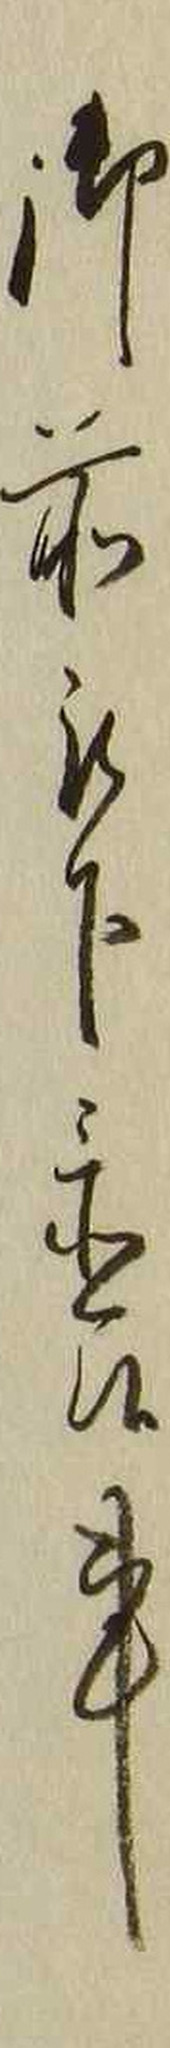御前被下置候事
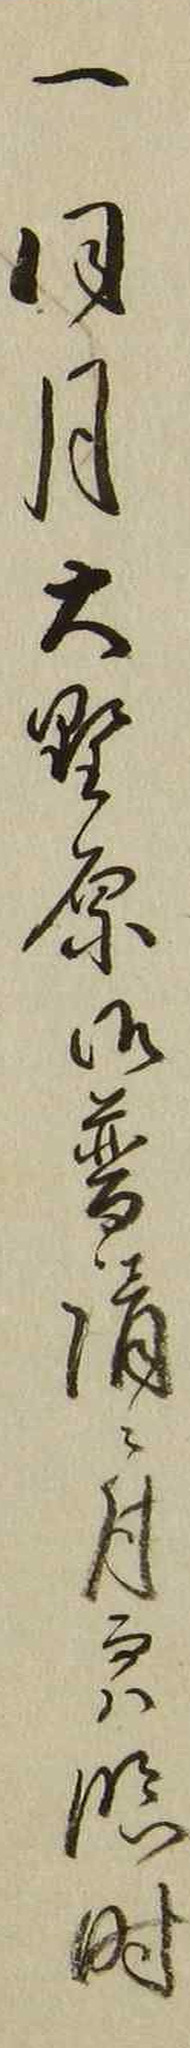一同月大野原御普請に付而は臨時
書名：諸士系譜　巻之1　い之部1
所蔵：会津若松市立会津図書館
